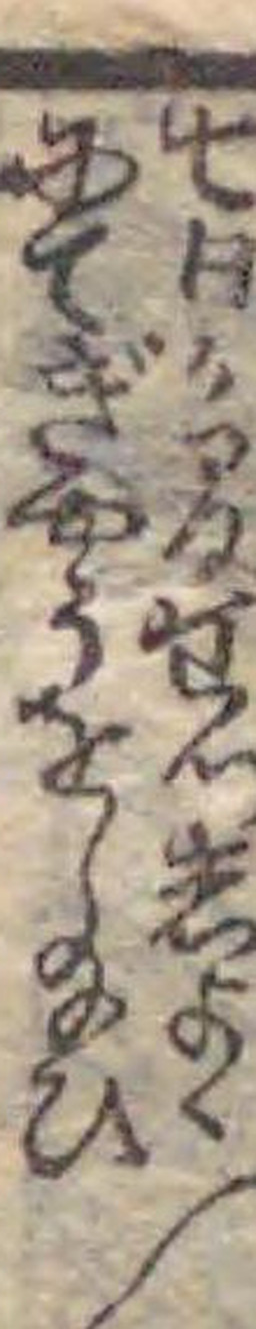にてぎやうをし給ひ
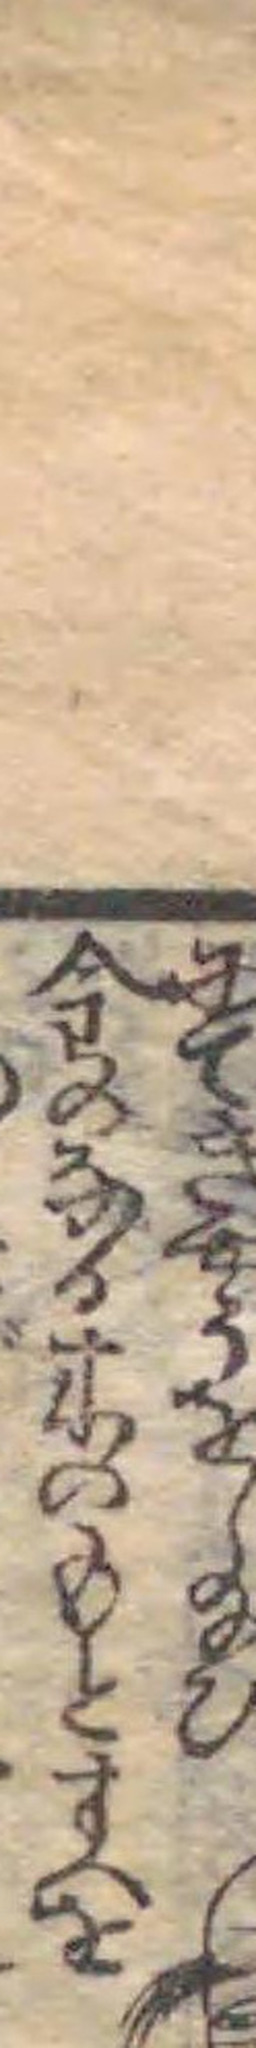金のなる木のもとすへを
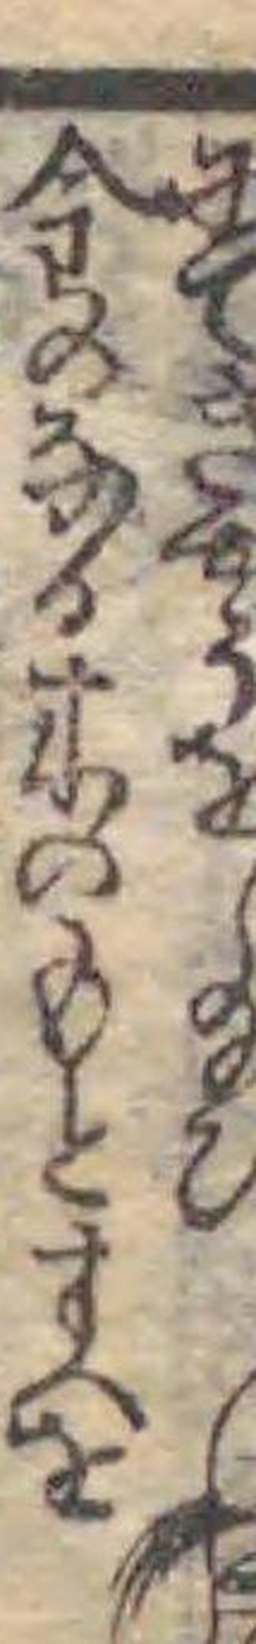金のなる木のもとすへを
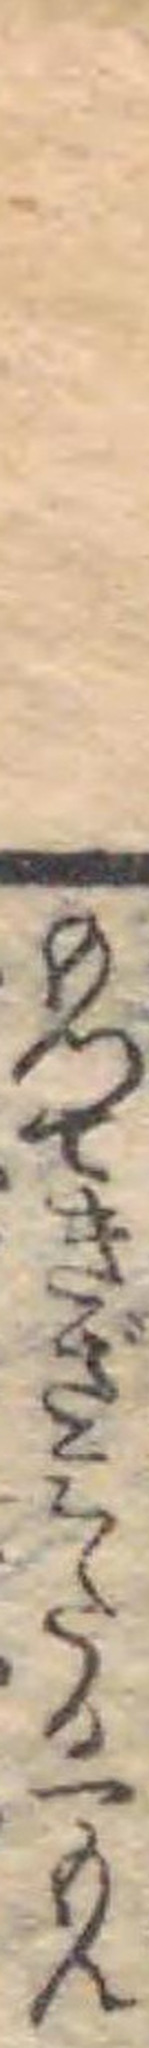もつてきざみたる一もん
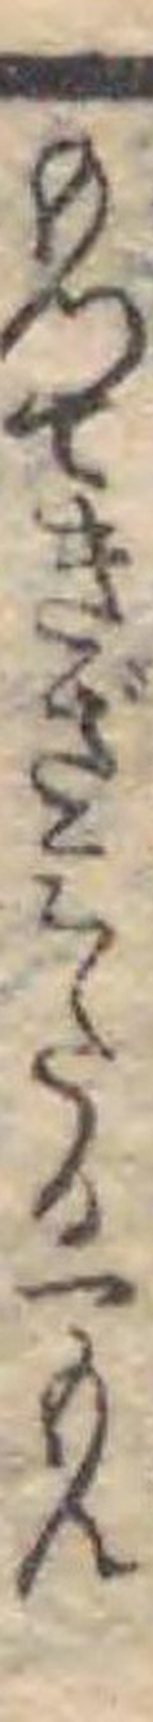もつてきざみたる一もん
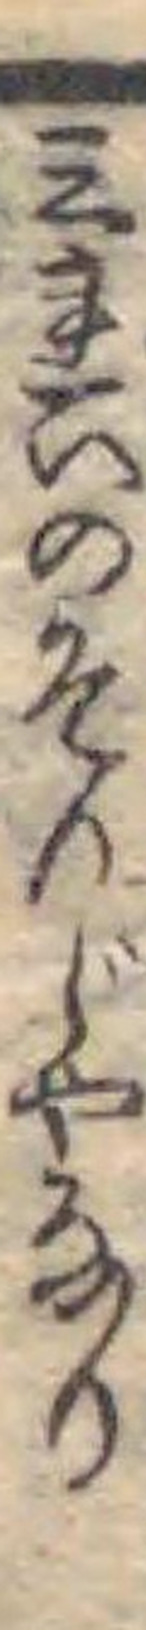三れいのそんじやなり
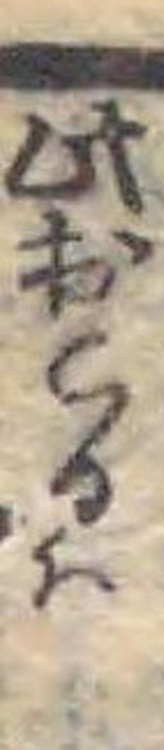此おこるは
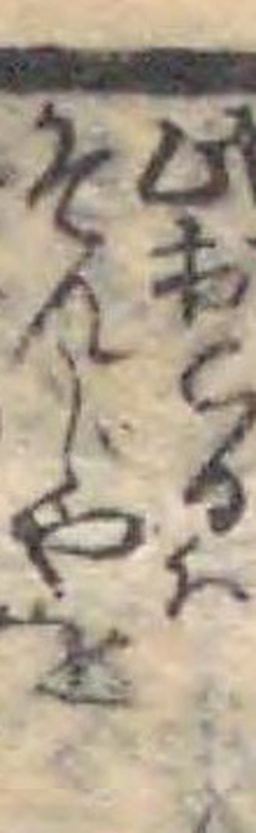そんじやを
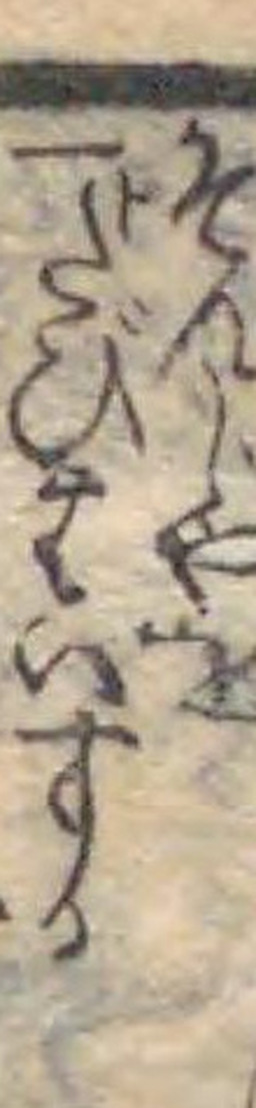一とたびはいする
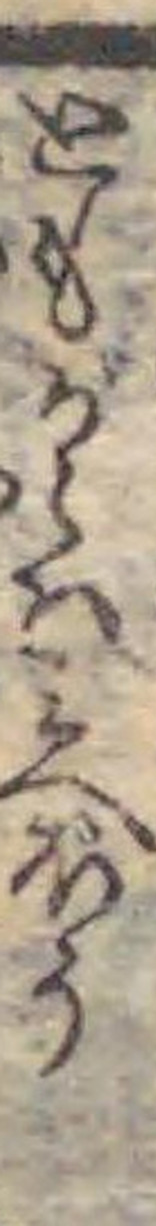ともがらはみへぼう
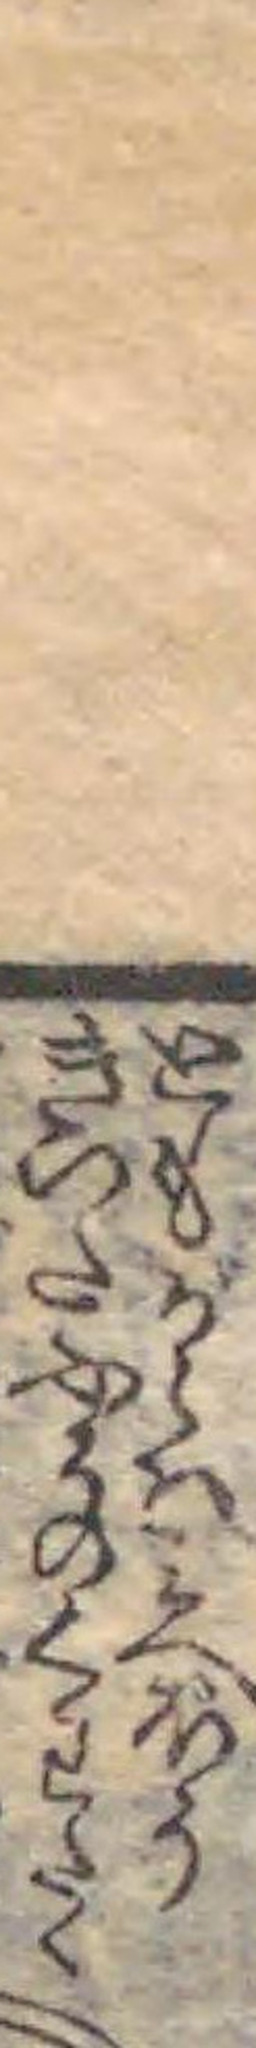きいたふうのくわたく
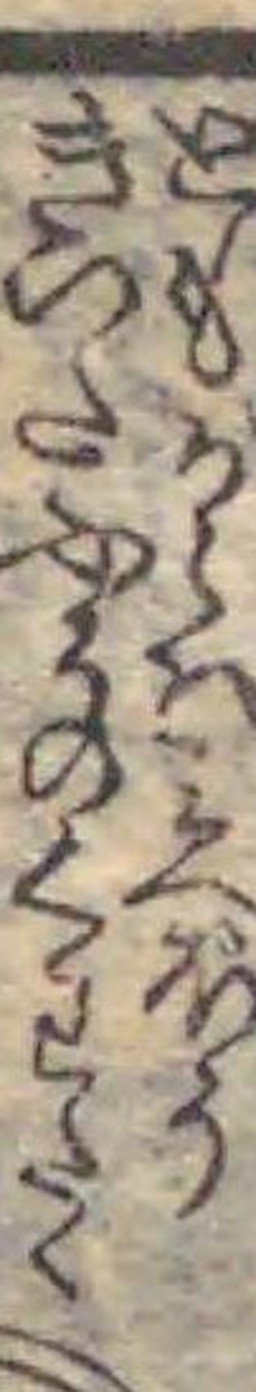きいたふうのくわたく
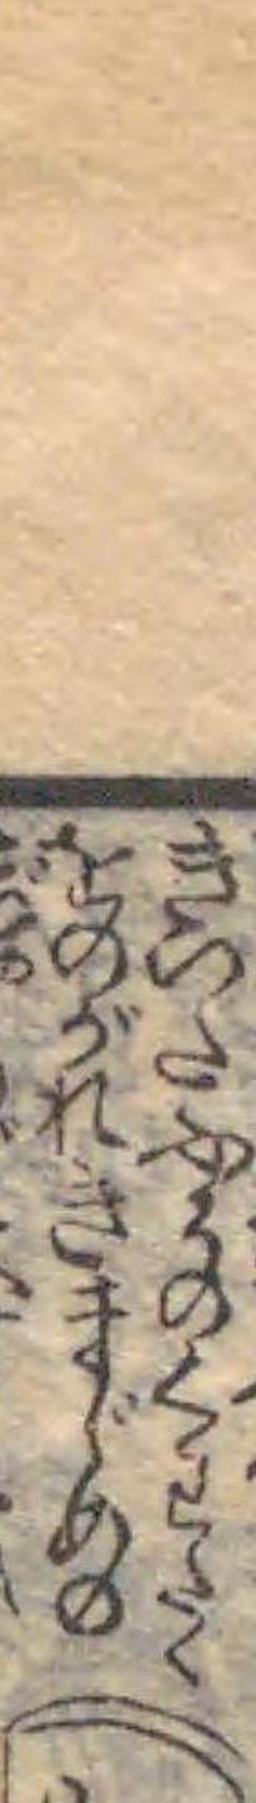をのがれきまじめの
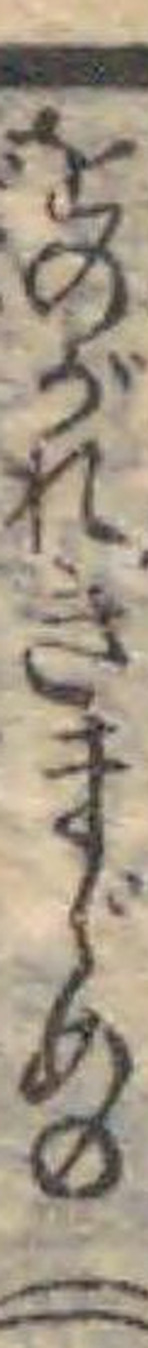をのがれきまじめの
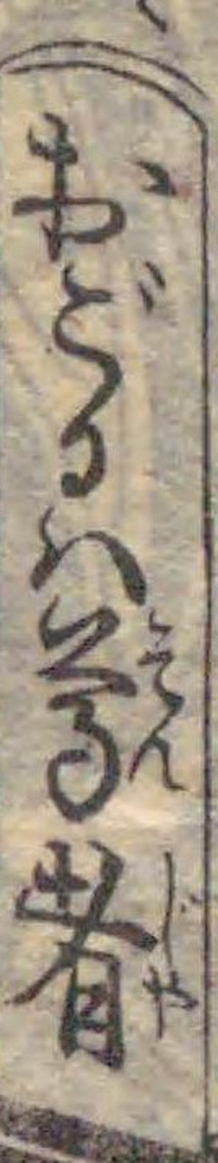おごるは尊者
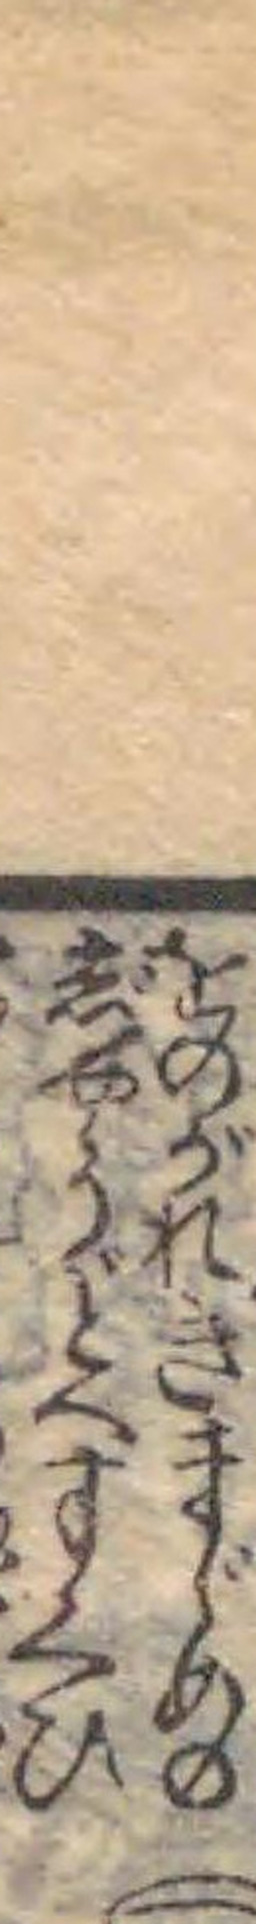じやうどへすくひ
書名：身体開帳略縁起 : 3巻
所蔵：国立国会図書館 National Diet Library, JAPAN
